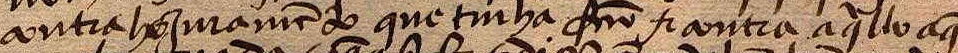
contra o Juramēto que tinha fcc̄o e contra aq̄llo a q̄
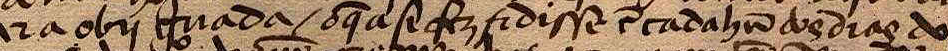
era obrjguada / o q̄ asi fez e disse ē cada hū dos dias do
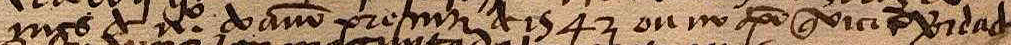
mes de n.o do an̄o presente de 1543 ou no tpō q̄ vier ē ꝟrdade
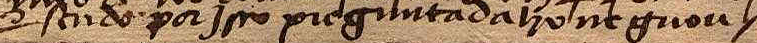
e sendo por Jsso preguntada ho neguou /
